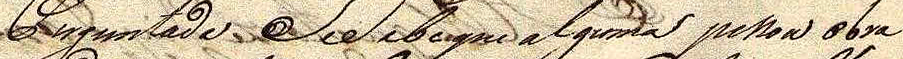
Perguntada se Sabe que alguma pessoa obra
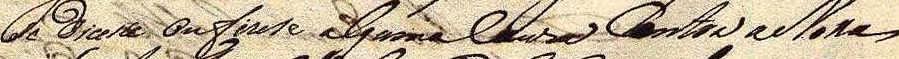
se dicesse ou fizese alguma couza Contra a Nossa
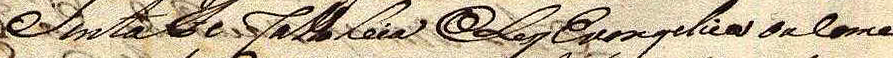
Santa Fe CathoLica e Ley Evangelica da como
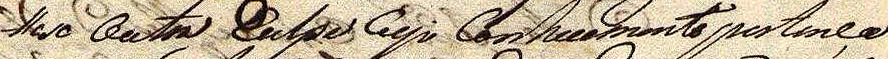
ttesse outra culpa cujo conhecimento pertença
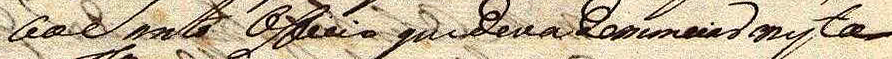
ao Santo Officio que deva denunciar nesta
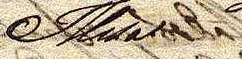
Mesa
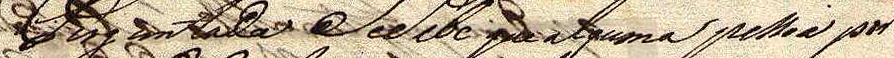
Perguntada se sabe que alguma pessoa por
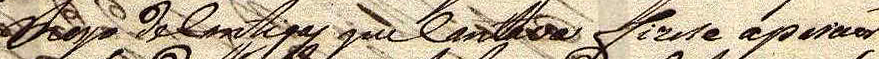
meyo de Cantigas que Cantava fizese aparecer
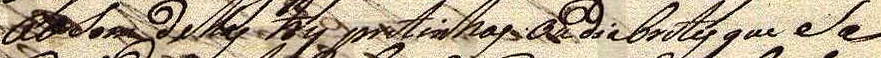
ao Som dellas tres pretinhos ou diabretes que sa
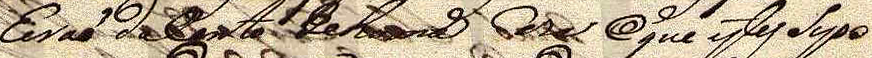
hiraõ do conto de huma caza e que estes se po
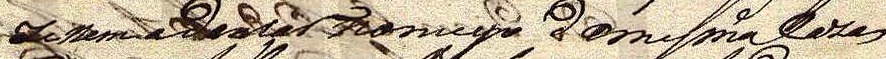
zessem a dançar no meyo da mesma caza
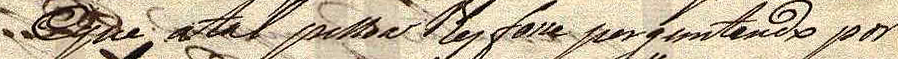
e que a tal pessoa lhes fosse perguntando por
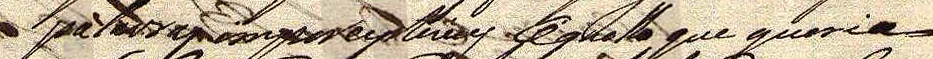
palavras imperceptiveis aquello que queria
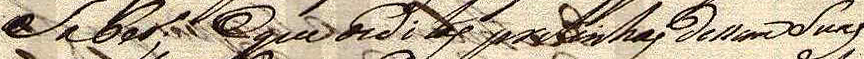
saber; e que os ditos pretinhos dessem suas
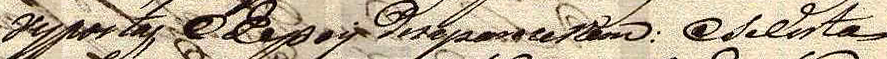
respostas, e depois deseparecessem: e se certa
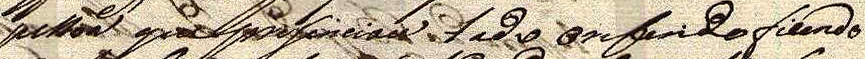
pessoa que presenciou todo o referido ficando
